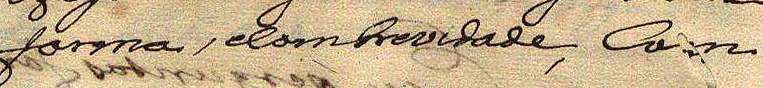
forma, e com brevidade, Com
